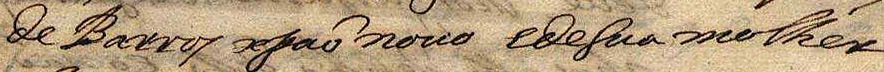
de Barros xpaõ nouo E de sua molher
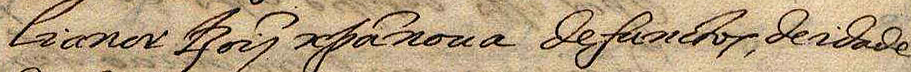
lianor Roiz̄ xpã noua defunctos, de idade
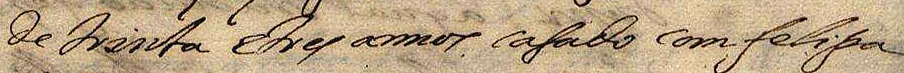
de trinta E tres anos casado com felipa
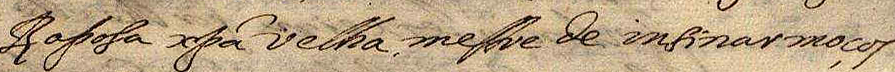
Raposa xpã velha, mestre de insinar moços
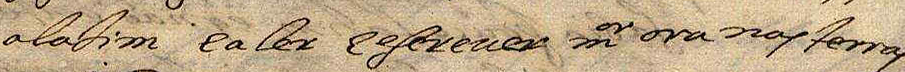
a latim e a ler E escreuer mor ora nas terras
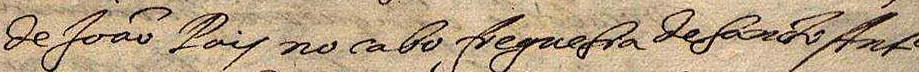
de Joaõ Pais no cabo freguesia de Sancto Anto
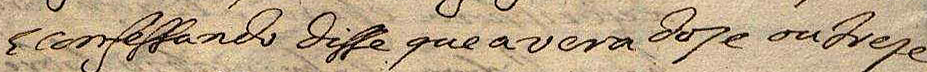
E confessando disse que avera doze ou treze
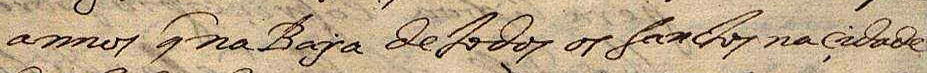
annos q̄ na Baya de todos os Sanctos na çidade
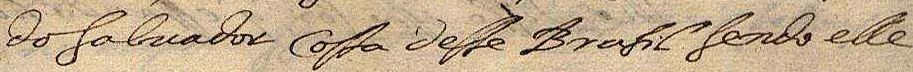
do Saluador Costa desse Brasil sendo elle
